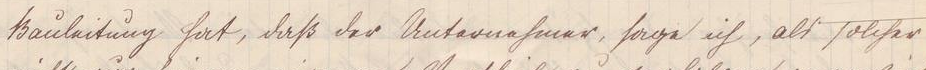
Bauleitung hat, daß der Unternehmer, sage ich, als solcher
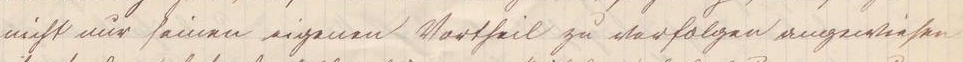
nicht nur seinen eigenen Vortheil zu verfolgen angewiesen
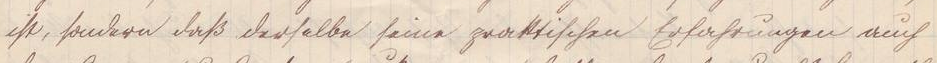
ist, sondern daß derselbe seine praktischen Erfahrungen auch
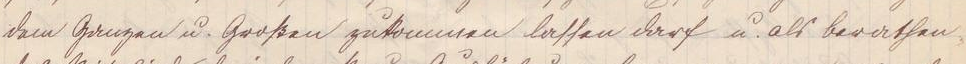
dem Ganzen u. Großen zukommen lassen darf u. als berathen-
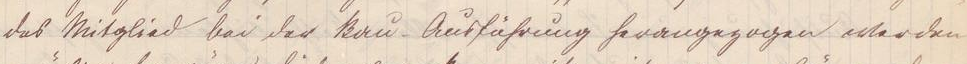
des Mitglied bei der Bau-Ausführung herangezogen werden
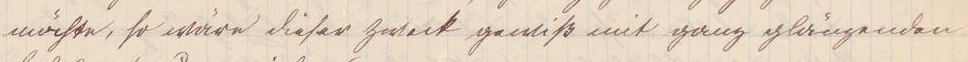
möchte, so wäre dieser Zweck gewiß mit ganz glänzenden
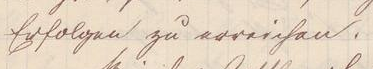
Erfolgen zu erreichen.
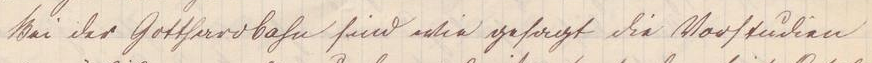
Bei der Gotthardbahn sind wie gesagt die Vorstudien
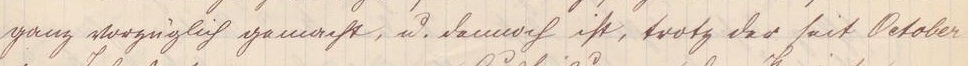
ganz vorzüglich gemacht, u. dennoch ist, trotz der seit October
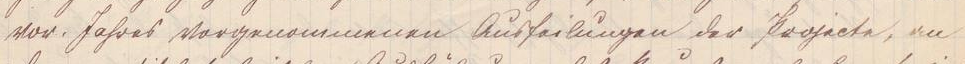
vor. Jahres vorgenommenen Ausfeilungen der Projecte, an
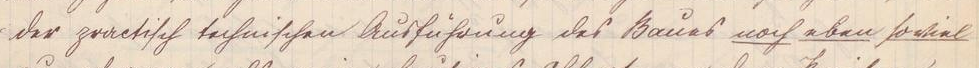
der practisch technischen Ausführung des Baues nochebensoviel
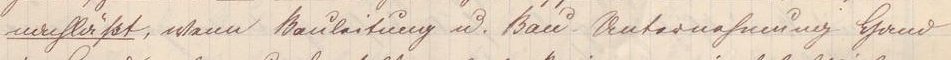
nachläßt, wenn Bauleitung u. Bau-Unternehmung Hand
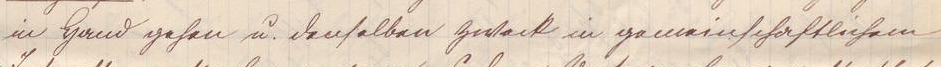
in Hand gehen u. denselben Zweck in gemeinschaftlichem
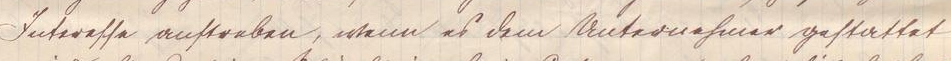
Interesse anstreben, wenn es dem Unternehmer gestattet
